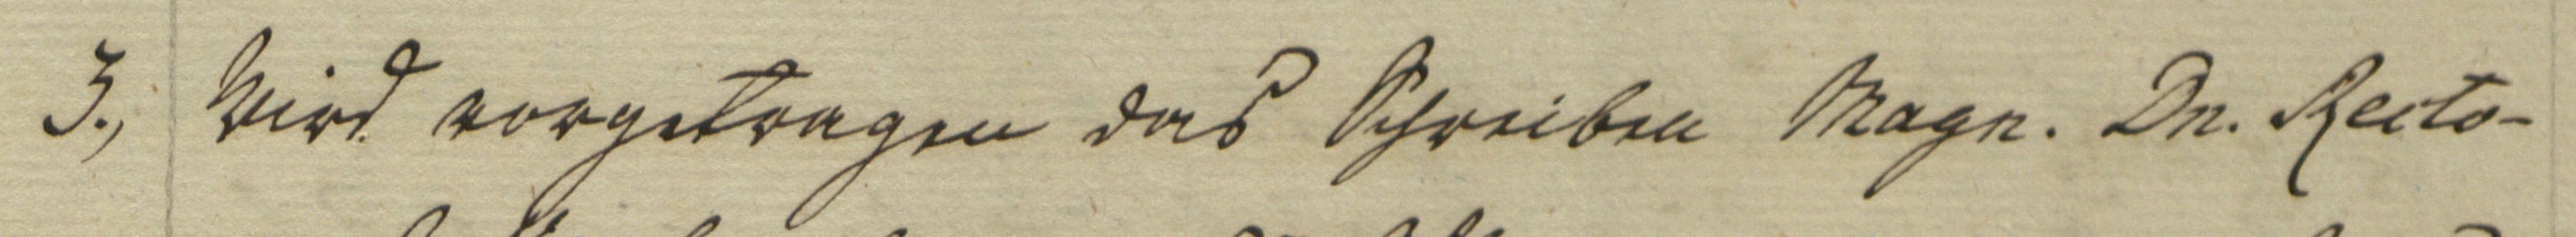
3., Wird vorgetragen das Schreiben Magn. Dn. Recto¬
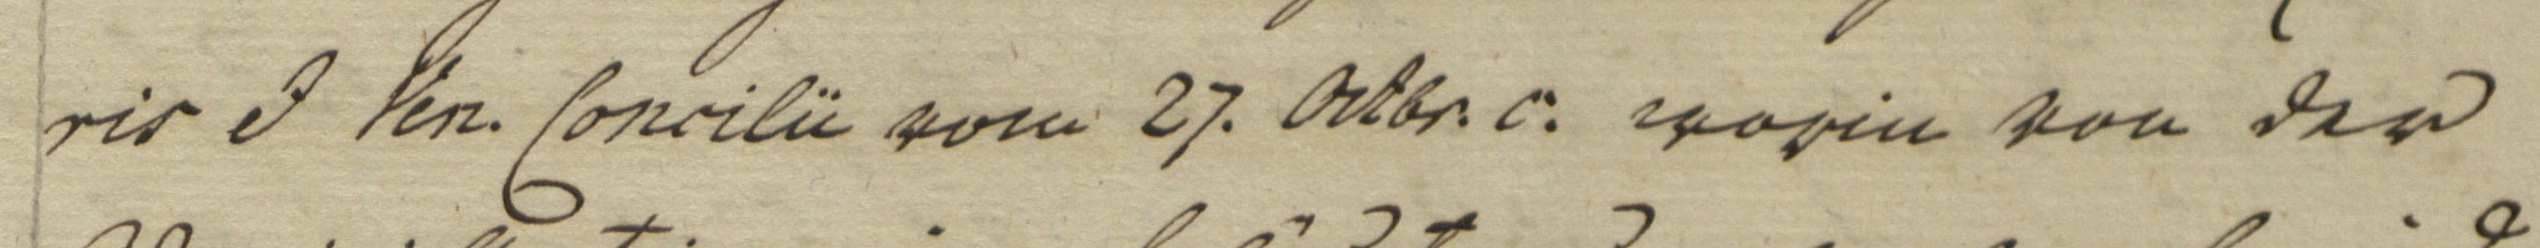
ris et Ven. Concilii vom 27. Octbr. c. worin von der
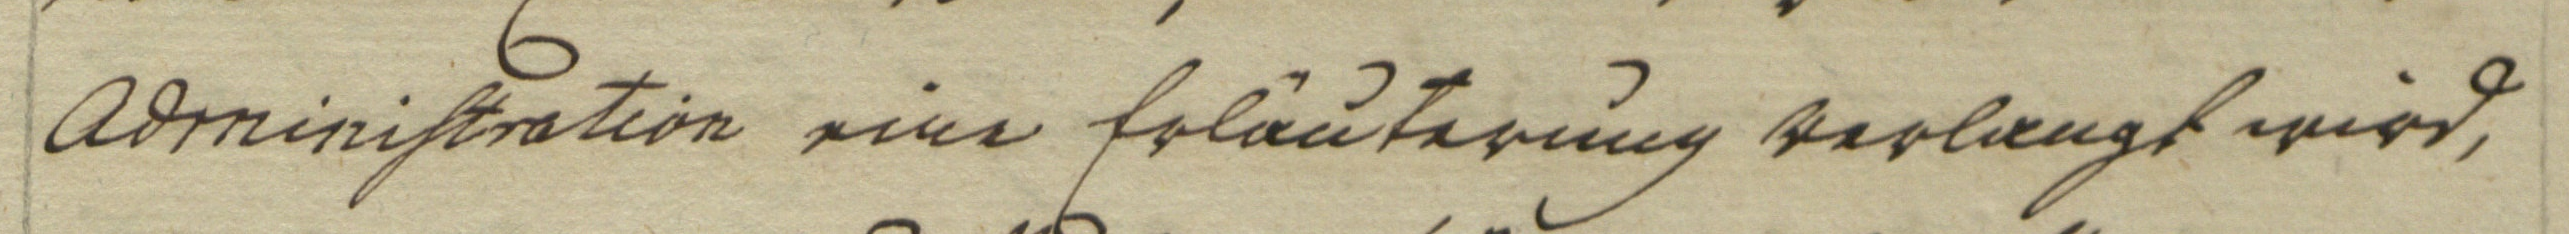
Administration eine Erläuterung verlangt wird,
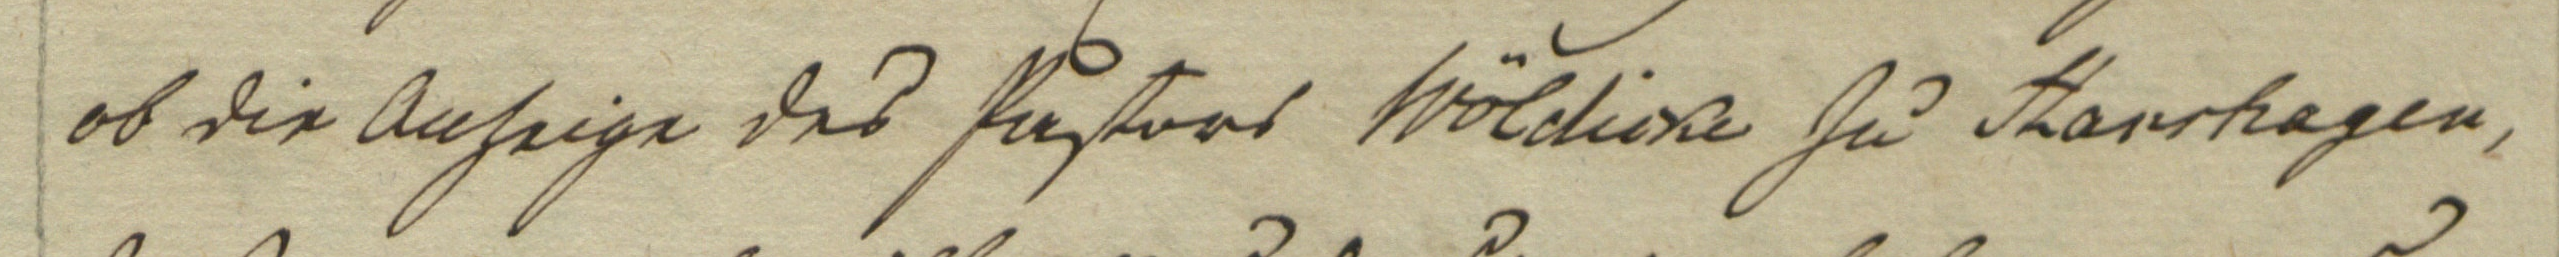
ob die Anzeige des Pastors Wöldicke zu Hanshagen,
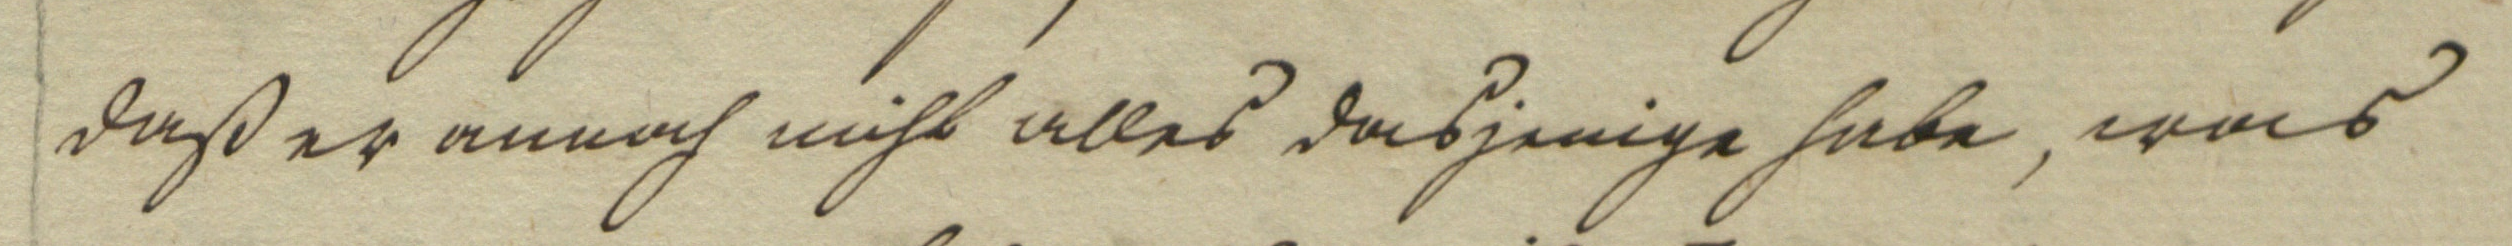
daß er annoch nicht alles dasjenige habe, was
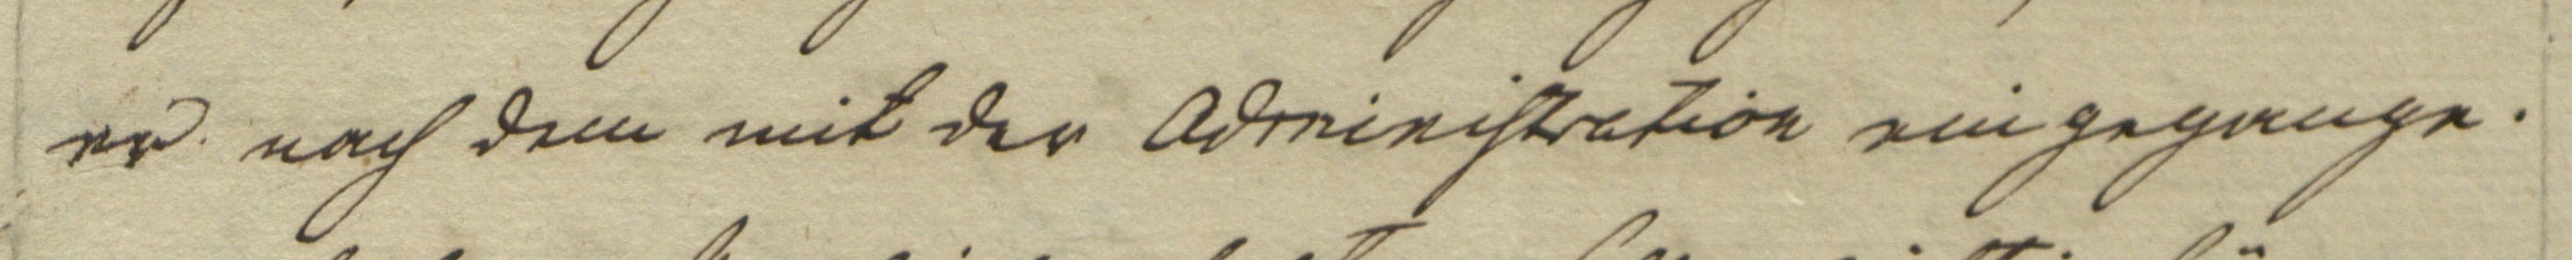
er nach dem mit der Administration eingegange¬
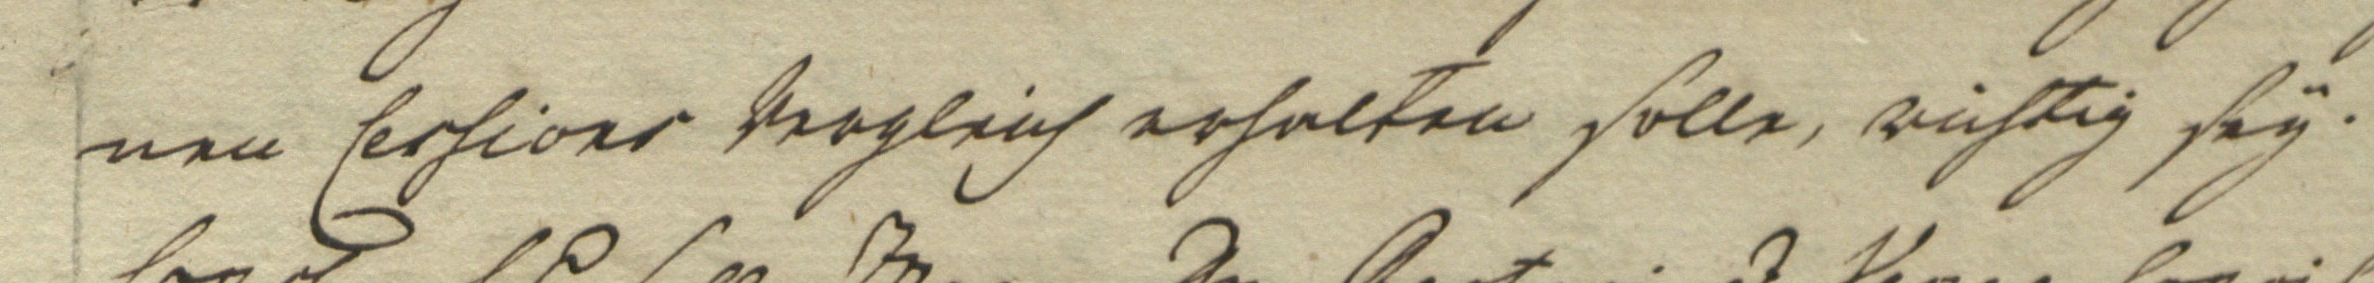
nen Cessions Vergleich erhalten solle, richtig seÿ.
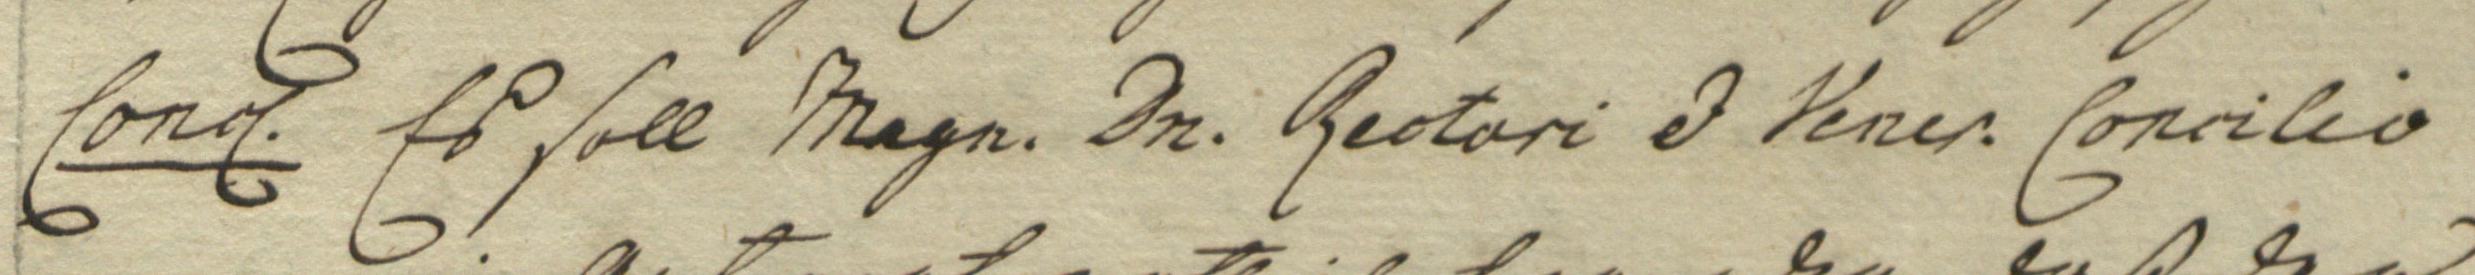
Concl. Es soll Magn. Dn. Rector et Vener. Concilio
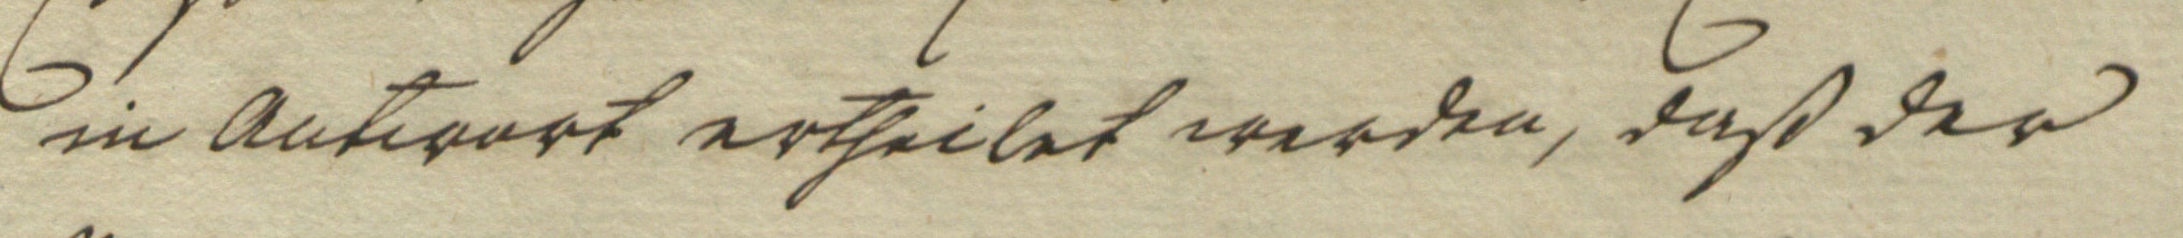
im Antwort ertheilet werden, daß der
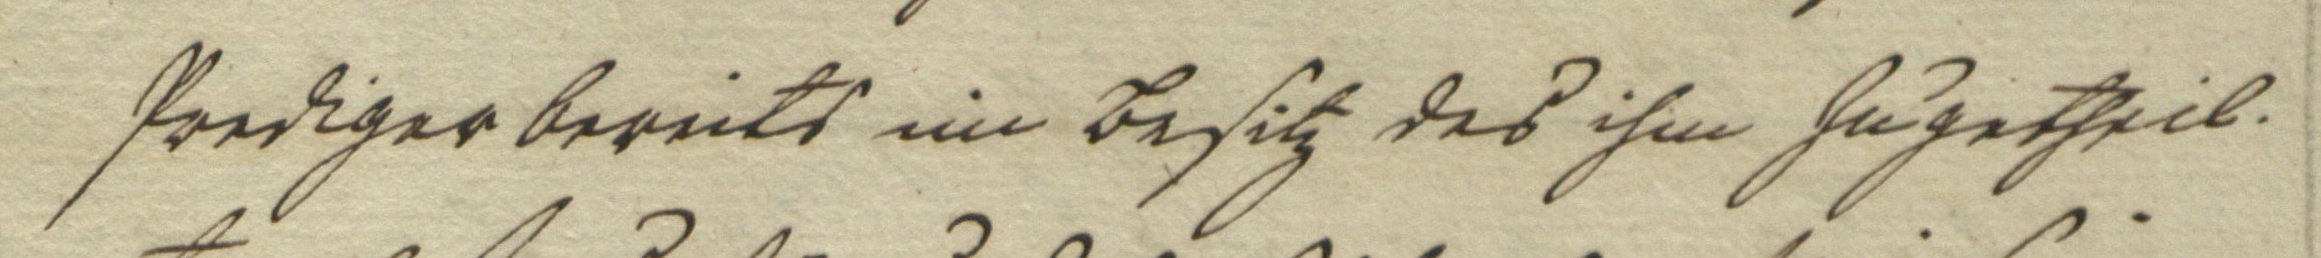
Prediger bereits im Besitz des ihm zugetheil¬
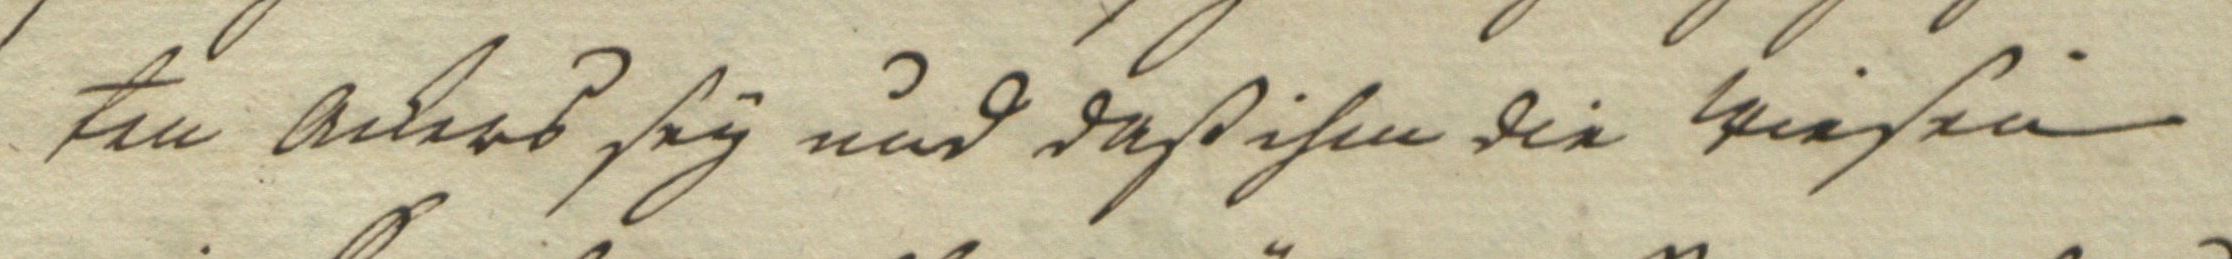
ten Ackers seÿ und daß ihm die Wiesen
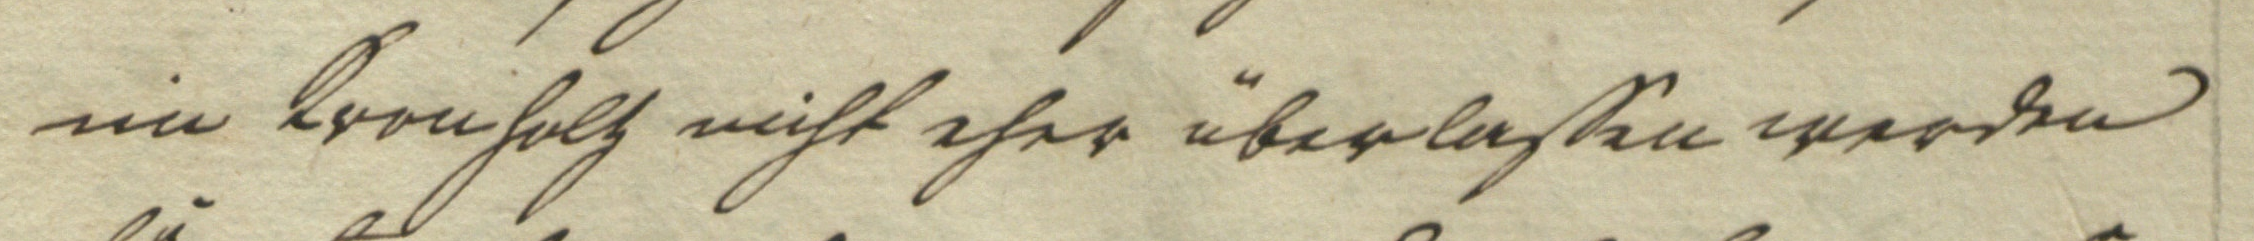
im Kronholz nicht eher überlassen werden
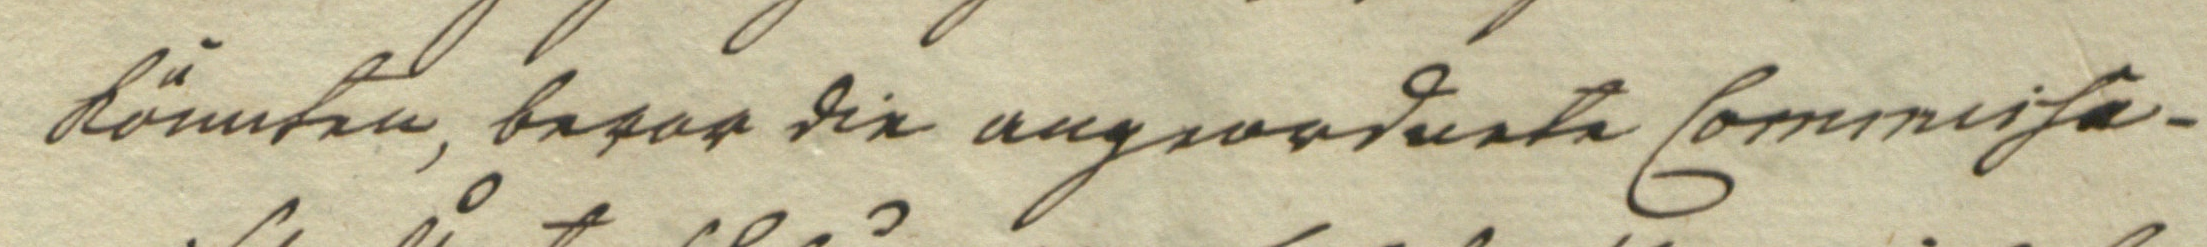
könnten, bevor die angeordnete Commissa¬
